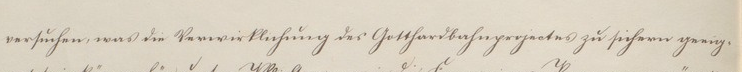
versuchen, was die Verwirklichung des Gotthardbahnprojectes zu sichern geeig-
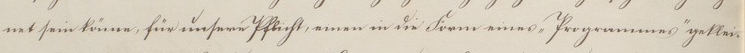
net sein könne, für unsere Pflicht, einen in die Form eines «Programmes» geklei-
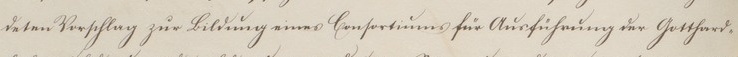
deten Vorschlag zur Bildung eines Consortiums für Ausführung der Gotthard -
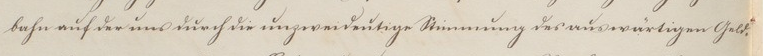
bahn auf der uns durch die unzweideutige Stimmung des auswärtigen Geld-
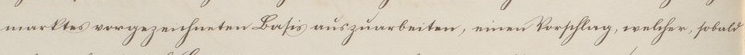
marktes vorgezeichneten Basis auszuarbeiten, einen Vorschlag, welcher, sobald
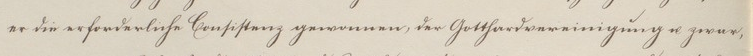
er die erforderliche Consistenz gewonnen, derGotthardvereinigung & zwar,
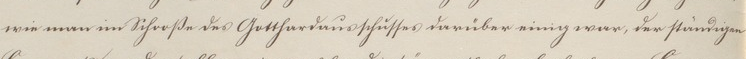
wie man im Schooße des Gotthardausschusses darüber einig war, der ständigen
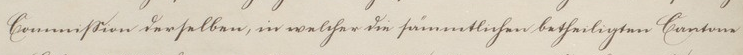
Commission derselben, in welcher die sämmtlichen betheiligten Cantone
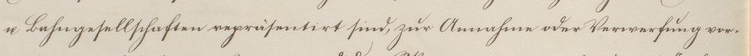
& Bahngesellschaften repräsentirt sind, zur Annahme oder Verwerfung vor-
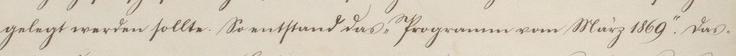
gelegt werden sollte. So entstand das «Programm vom März 1869». Das-
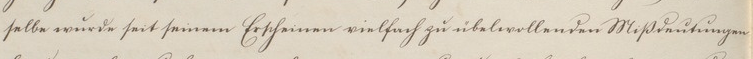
selbe wurde seit seinem Erscheinen vielfach zu übelwollenden Mißdeutungen
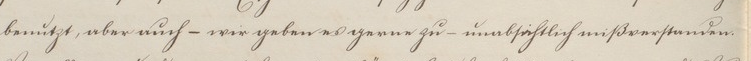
benutzt, aber auch – wir geben es gerne zu – unabsichtlich mißverstanden.
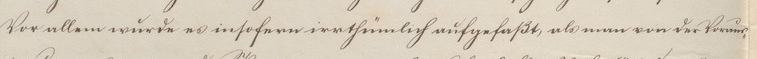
Vor allem wurde es insofern irrthümlich aufgefaßt, als man von der Voraus-
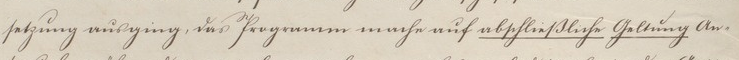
setzung ausging, das Programm mache auf abschließlicheGeltung An-
